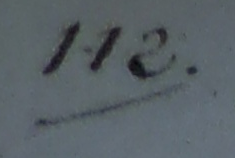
112.
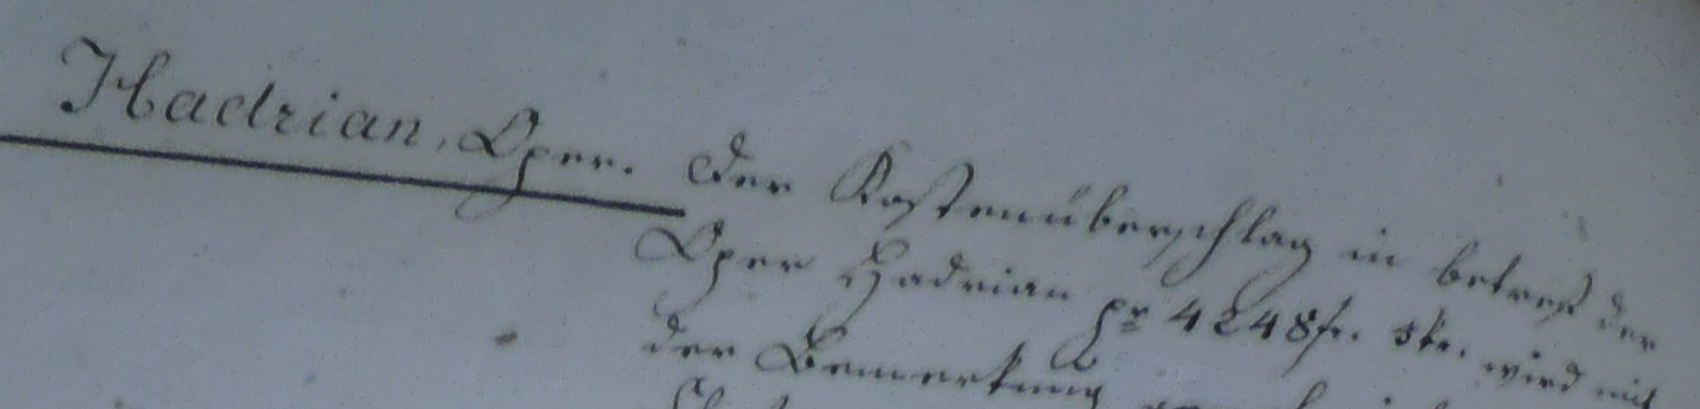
Hadrian, Oper. Der Kostenüberschlag in betref der
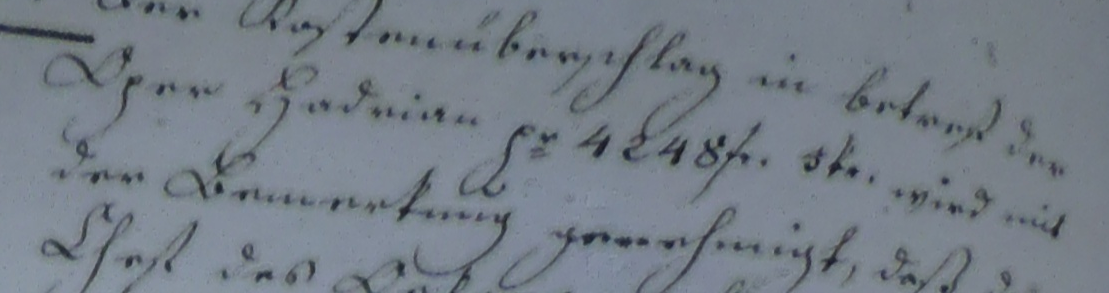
Oper Hadrian pr͇ 4248fr. 5kr. wird mit
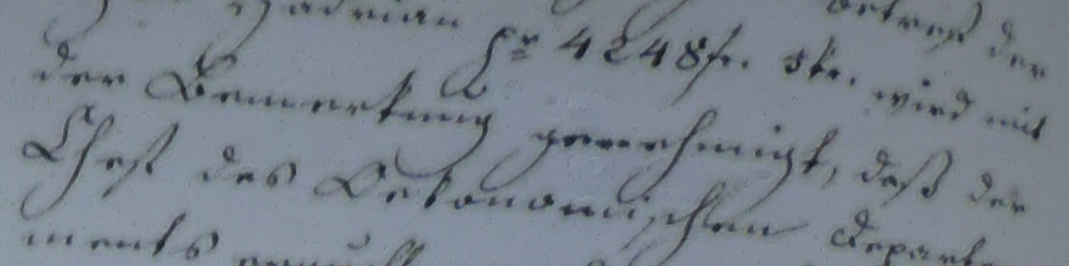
der Bemerkung genehmigt, daß der
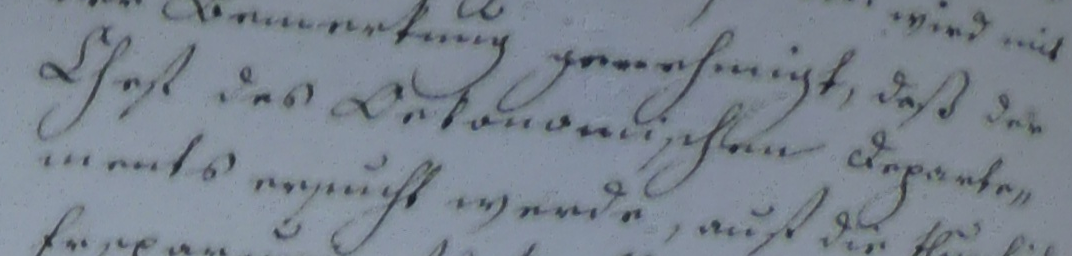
Chef des Oekonomischen Departe¬
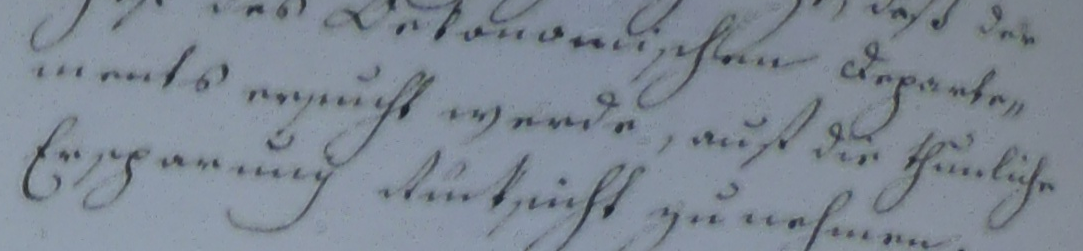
ments ersucht werde, auf die thunliche
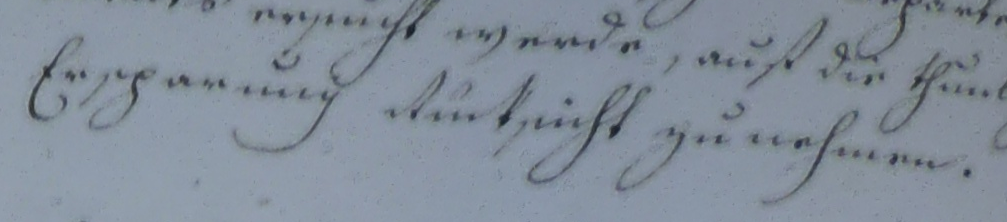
Ersparung Rücksicht zunehmen.
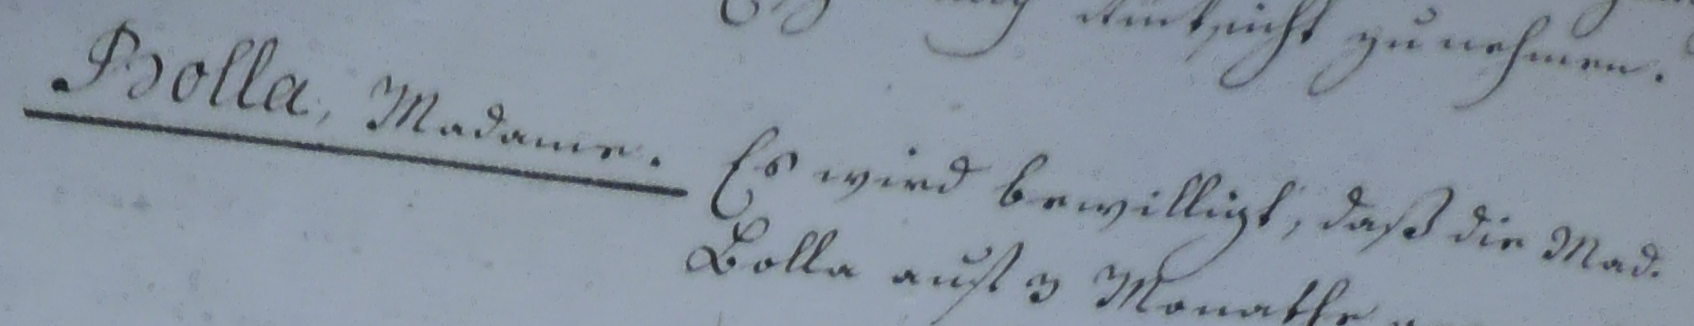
Bolla, Madame. Es wird bewilligt, daß die Mad.
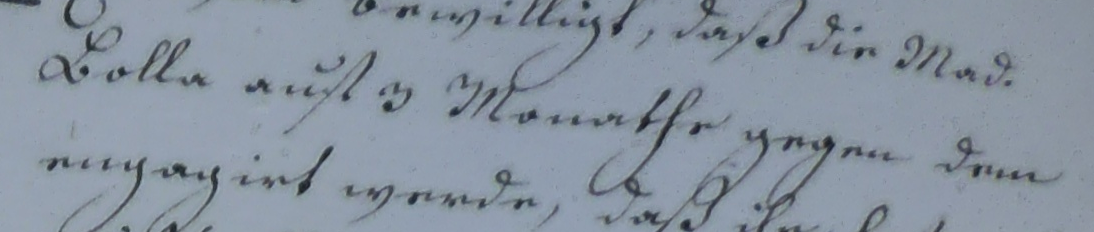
Bolla auf 3 Monathe gegen dem
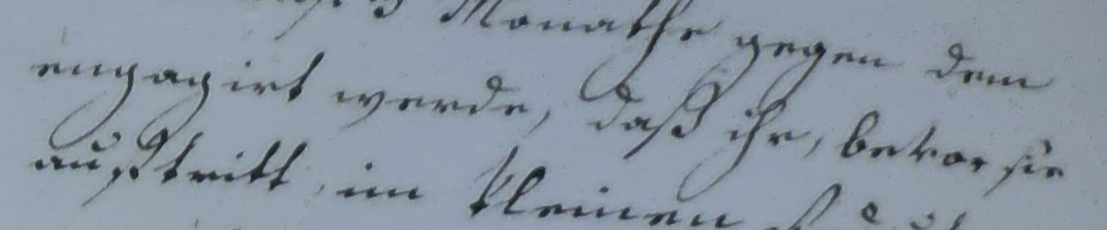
engagirt werde, daß ihr, bevor sie
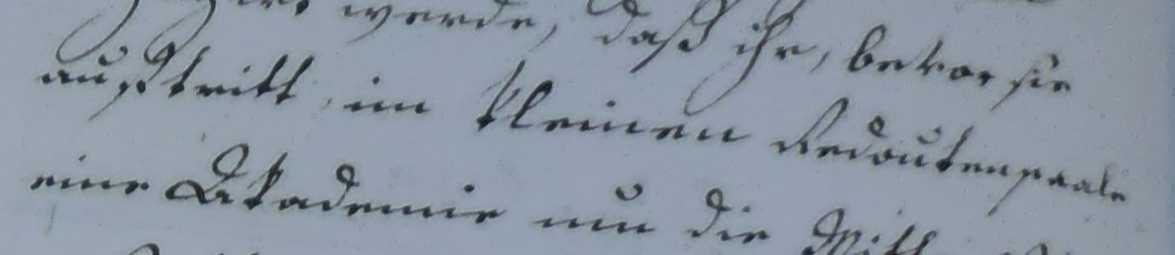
auftritt im kleinen Redoutensaale
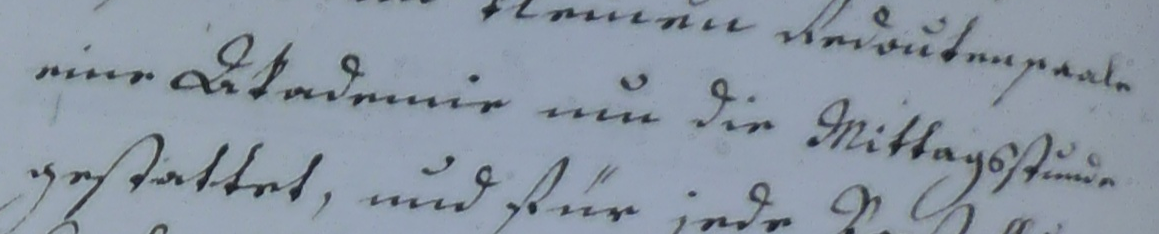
eine Akademie um die Mittagstunde
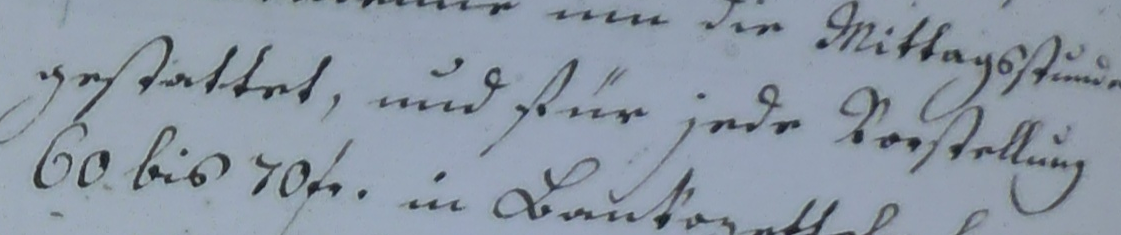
gestattet, und für jede Vorstellung
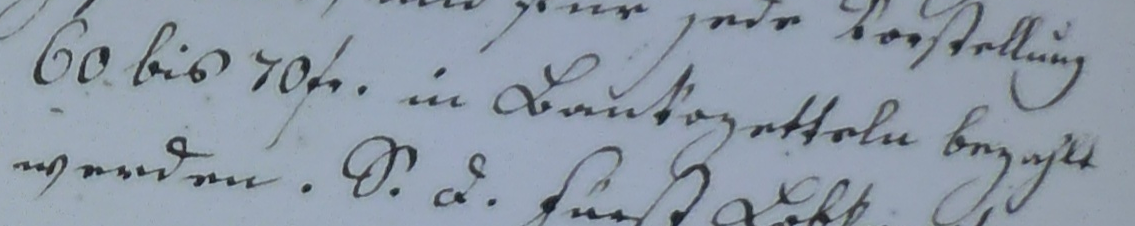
60 bis 70fr. in Bankozetteln bezahlt
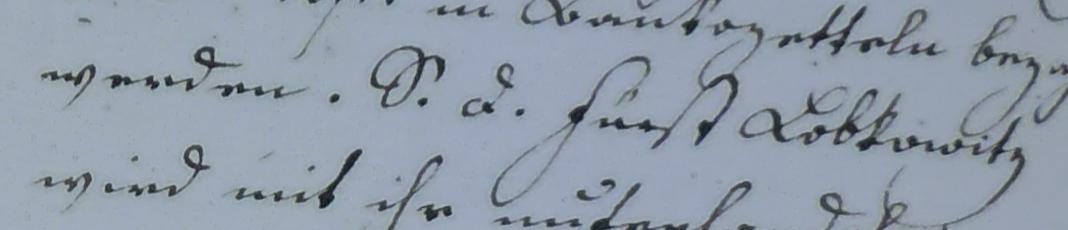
werden. S. D. Fürst Lobkowitz
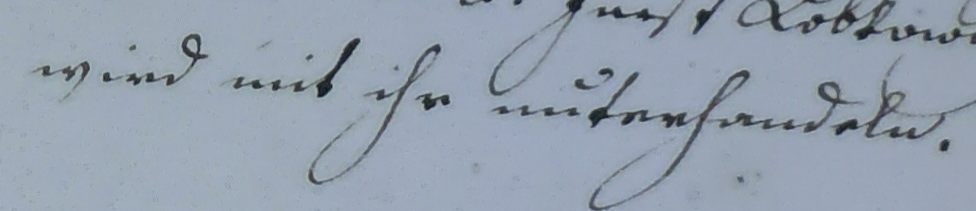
wird mit ihr unterhandeln.
